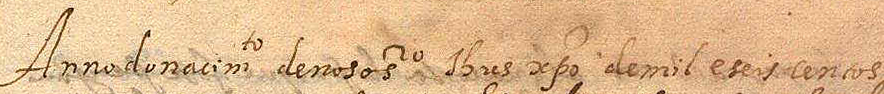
Anno do nacimto de noso sro Ihus xpō de mil e seiscentos
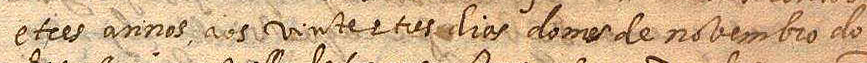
e tres annos, aos vinte e tres dias do mes de novembro do
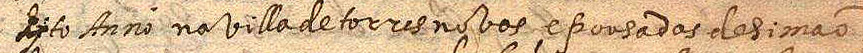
dito Anno na villa de torres novas e pousadas de simaõ
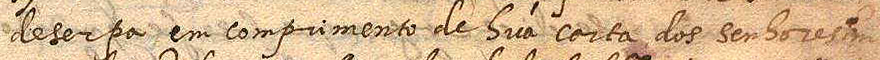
de serpa em comprimento de huā carta dos senhores Em
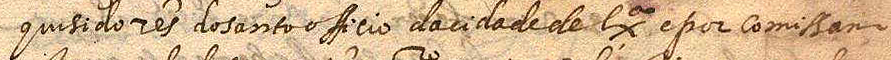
quisidores do santo officio da cidade de lxa e por comissam
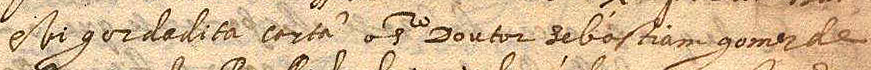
e vigor da dita carta o sro Doutor sebastiam gomez de
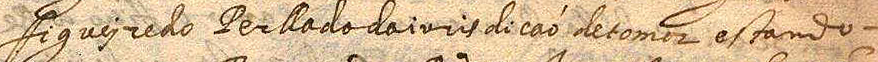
figuejredo Perllado da iurisdiçaõ de tomar estando
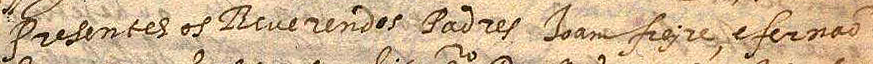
presentes os Reuerendos Padres Ioam freire, e fernaõ
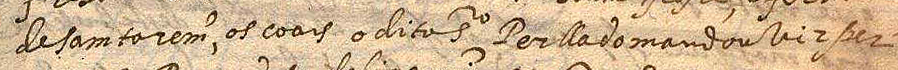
de samtarem, os coais o dito sro Perllado mandou vir per
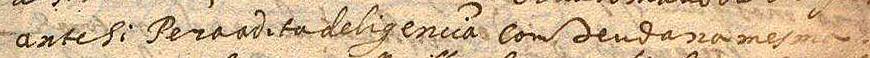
ante si Pera a dita deligencia conteuda na mesma
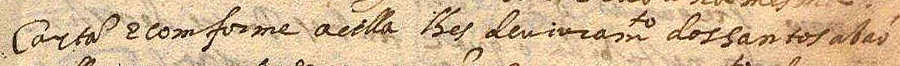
Carta E comforme a eella lhes deu iuramto dos santos avaõ
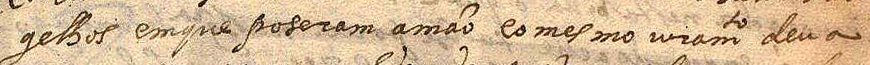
gelhos em que poseram a maõ e o mesmo iuramto deu a
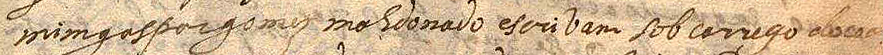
mim gaspar gomez maldonado escrivam sob carrego do coal
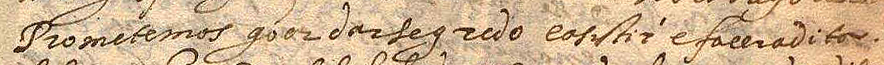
Prometemos goardar segredo e asistir e facer a dita
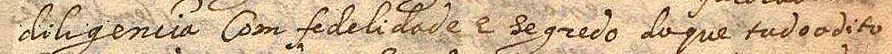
diligencia Com fedelidade E segredo do que tudo o dito
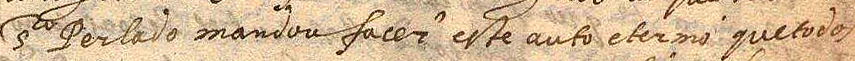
sro Perlado mandou facer este auto e termo que todos
